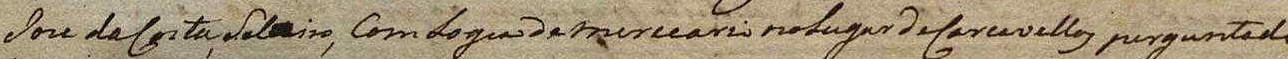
Ioze da Costa, Solteiro, Com Logia de merceario no Lugar de Carcavellos perguntado
